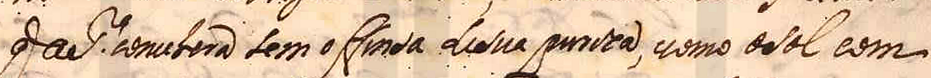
q̄ a S.ra concebera sem offensa de sua pureza, e como o Sol com
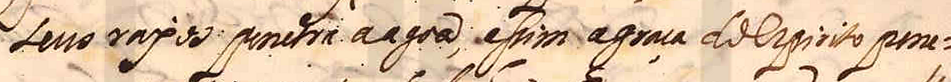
seus rayos penetra a agoa, assim a graça do Espirito pene
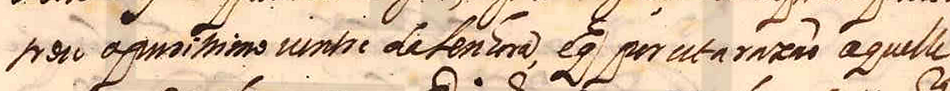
trou o purissimo uentre da Senhora, e q̄ por esta razaõ aquelle
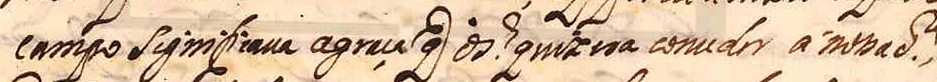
campo significaua a graça q̄ o s.or quizera conceder a nossa s.ra,
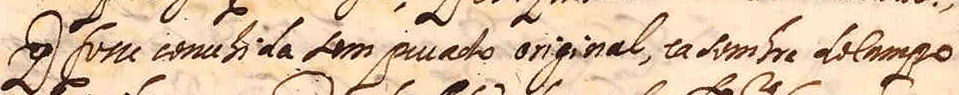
q̄ fosse concebida sem peccado original, e a sombra do Campo
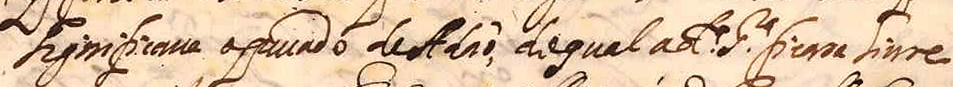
significaua o peccado de Adaõ, do qual a d̄.a s.ra ficara liure
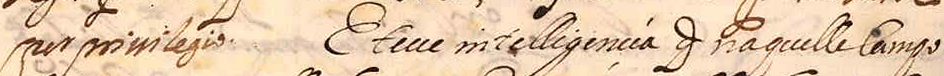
por priuilegio. E teue intelligencia q̄ naquelle campo
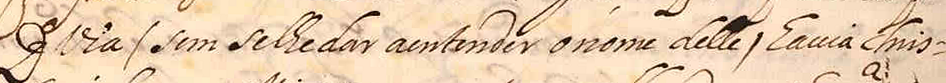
q̄ via (sem se lhe dar a entender o nome delle) hauia chris
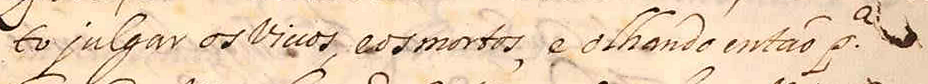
to julgar os viuos, e os mortos, e olhando entaõ p.a o
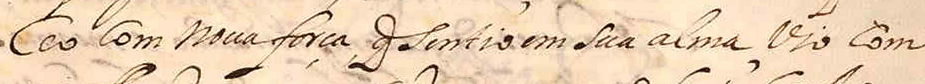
Ceo com noua força, q̄ sentio em sua alma, vio com
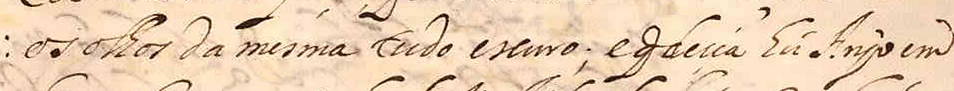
os olhos da mesma tudo escuro; e q̄ decia hū Anjo em
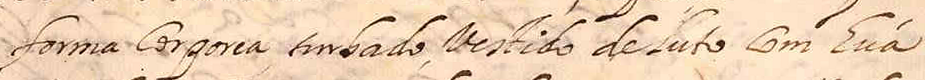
forma Corporea, turbado, vestido de luto com huā
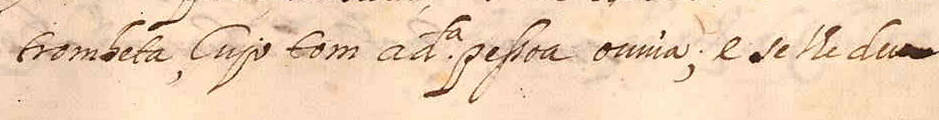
trombeta, Cujo tom a d̄.a pessoa ouuia; e se lhe deu
